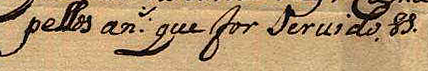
pellos an.s que for seruido. &s.
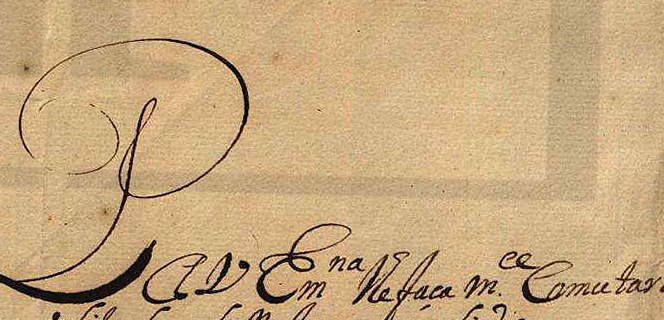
P a V Em.na lhe faça m.ce Comutar
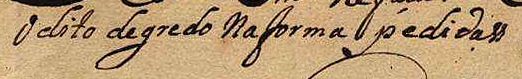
o dito degredo na forma pedida//
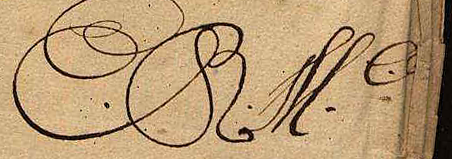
E. R. M.e
